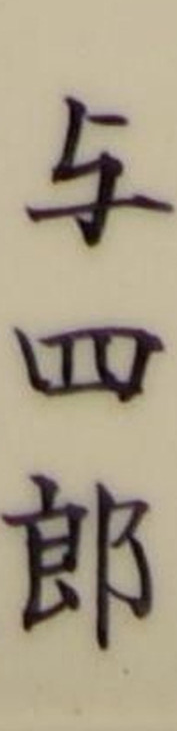与四郎
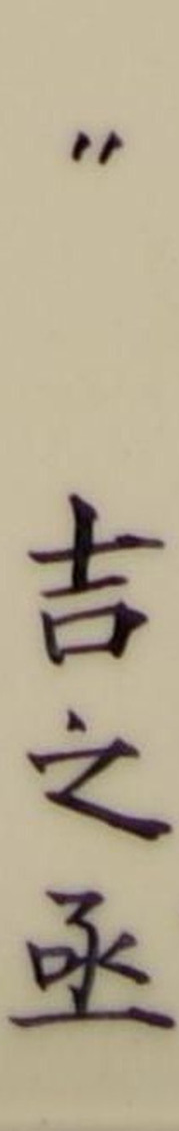吉之丞
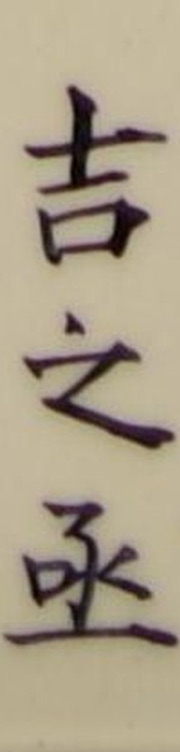吉之丞
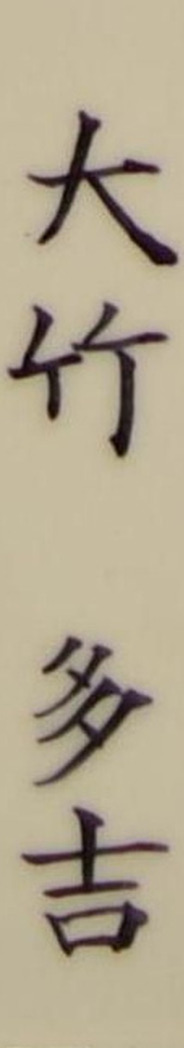大竹多吉
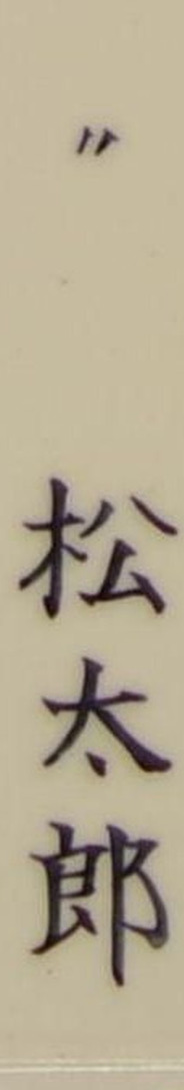松太郎
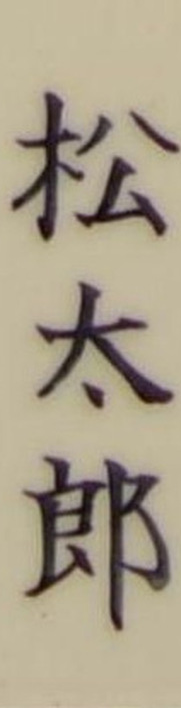松太郎
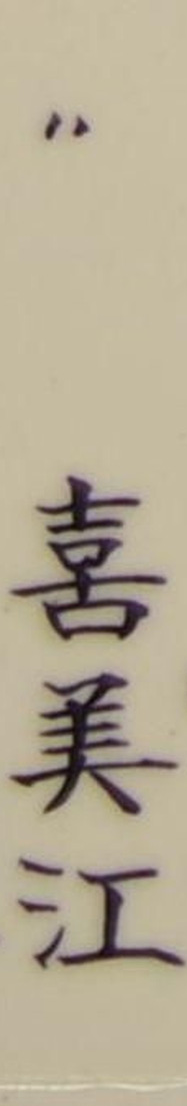喜美江
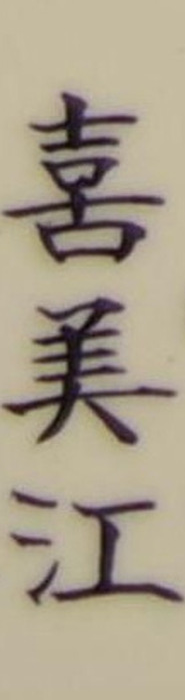喜美江
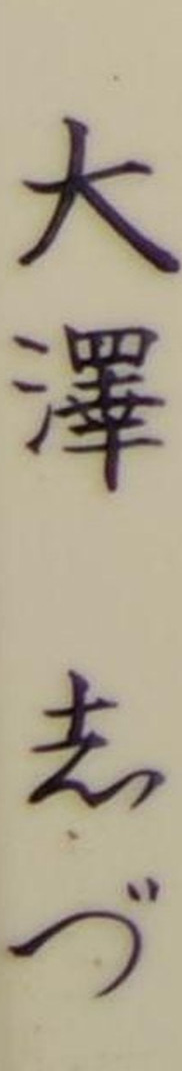大澤しづ

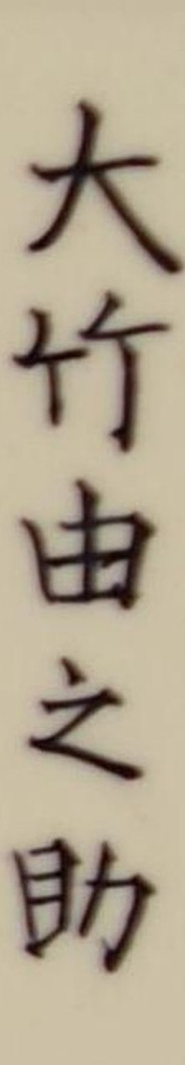大竹由之助
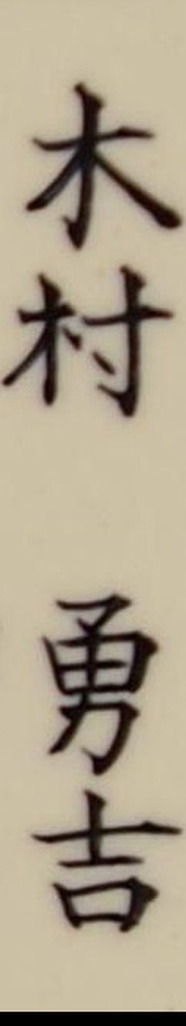木村勇吉
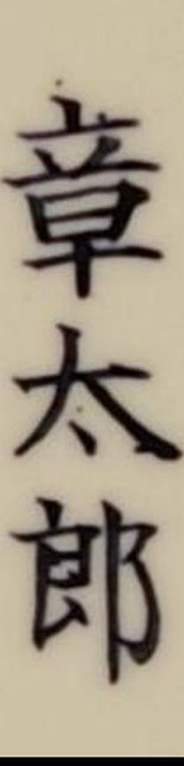章太郎
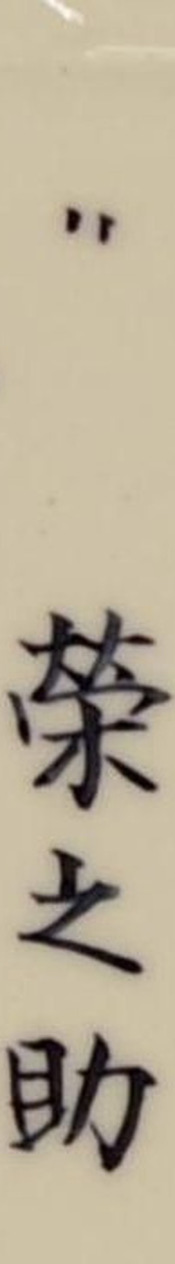榮之助
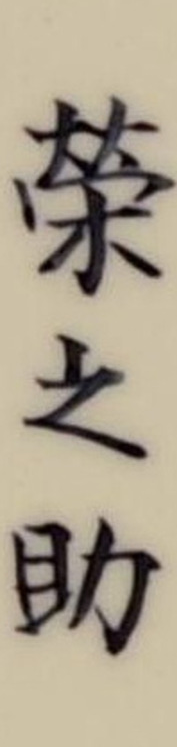榮之助
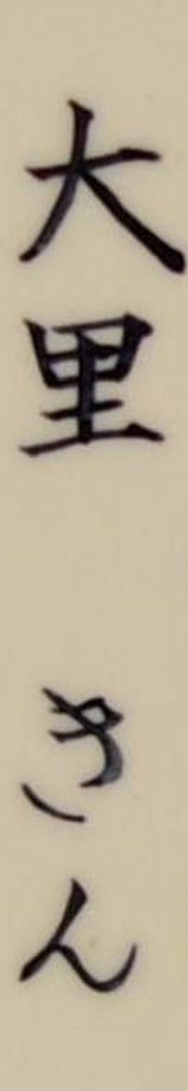大里きん
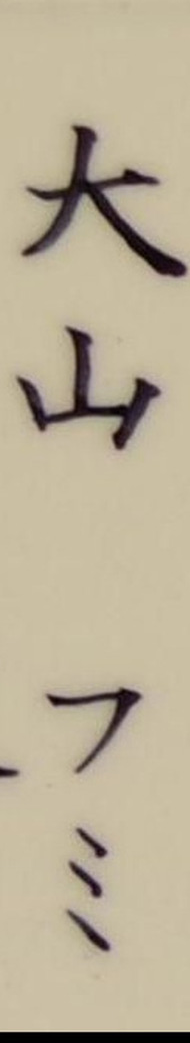大山フミ
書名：E~L
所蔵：高野山金剛峯寺
